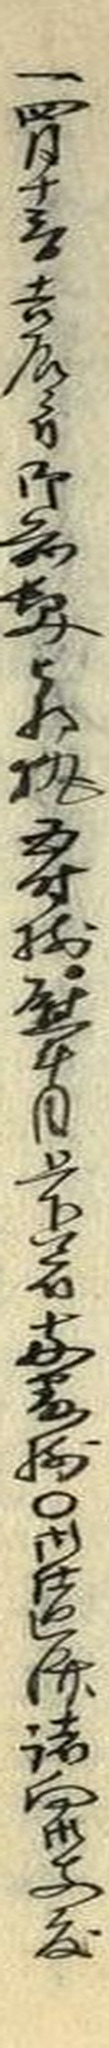一四月十三日吉辰ニ付御前髪被為執五時揃熨斗目上下着両番揃〇御仕廻済諸向御支度
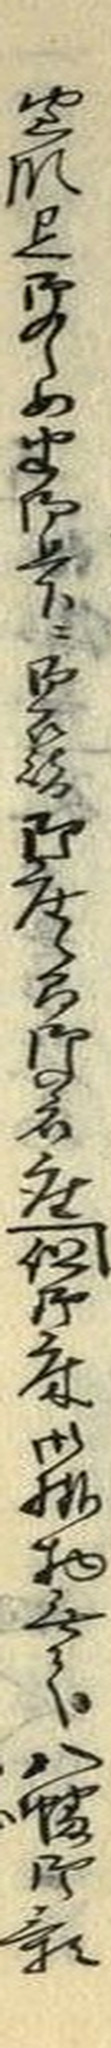宜段申上御のしめ半御上下ニ御召替御座之間御着座「但御床御掛物無之八幡御影
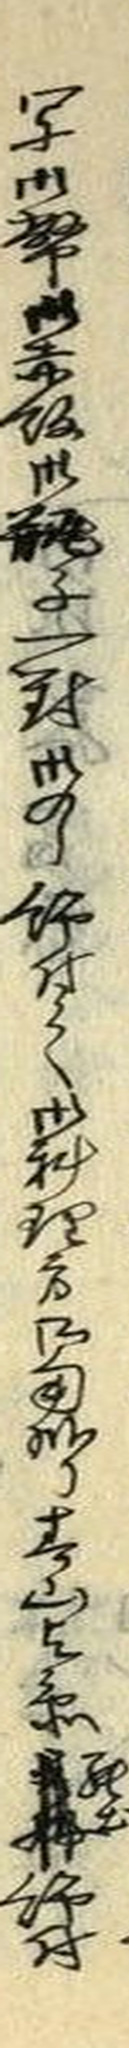写御幣御赤飯御瓶子一対御のし飾付之御料理方御用掛り青山与兵衛罷出飾付
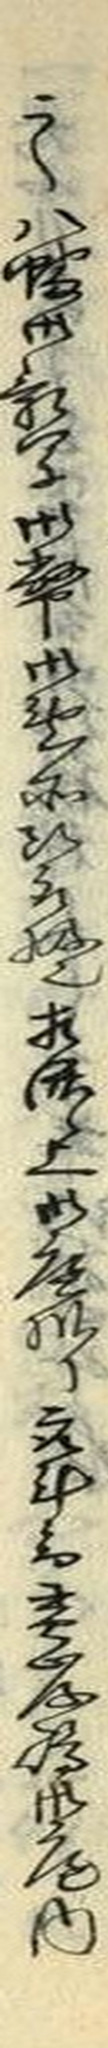之八幡御影写御幣御台所頭取扱之相済候上御庭掛り取計ニ而霊岸嶋御庭内
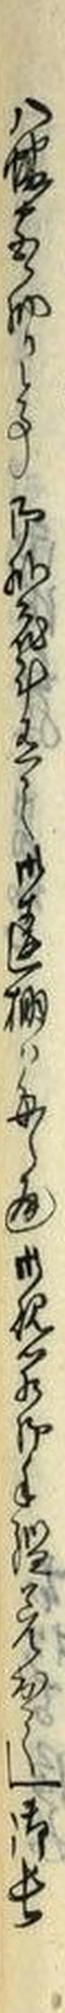八幡宮へ納候事御掛花斗有之御違棚ハ毎之通御硯箱御手鑑差出之」御長
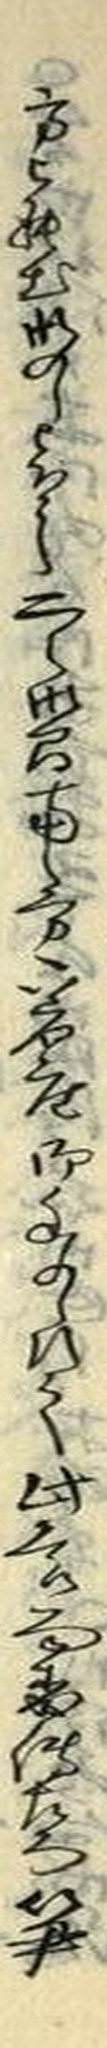方被罷出御のし被下之二之御間南之方へ着座御手のし引之此節雨森伝左衛門筆
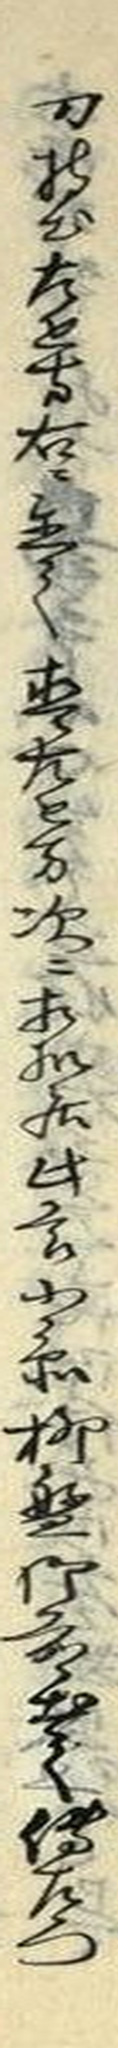刀持出左近方右ニ置之直ニ左近方次ニ相控居此節小兵衛柳盤御前へ出之伝左衛門
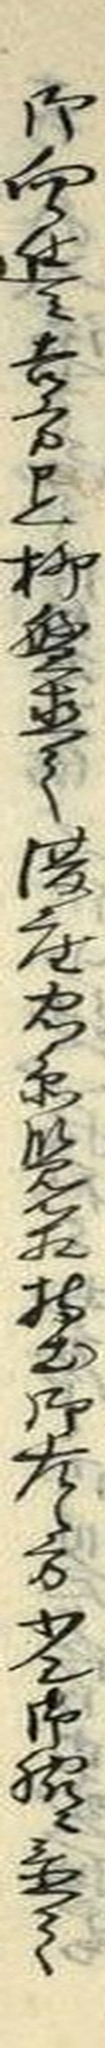御向へ進ミ吉方申上柳盤直之復座忠兵衛覧箱持出御左之方少シ御脇ニ置之
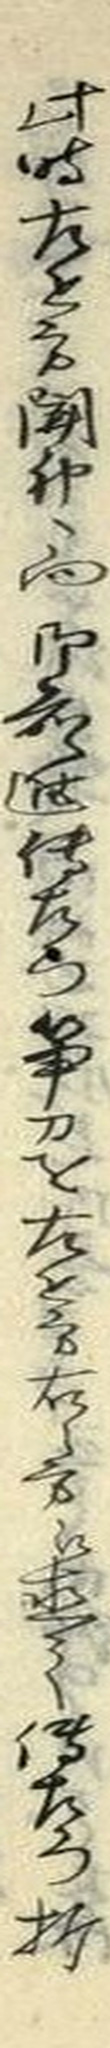此時左近方開神へ向御前へ進伝左衛門筆刀を左近方右之方江直之伝左衛門折
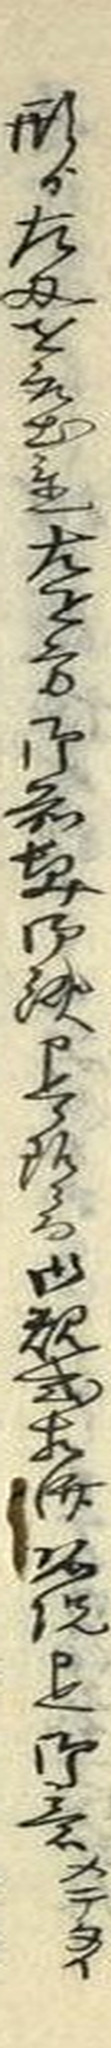形ゟ左刃を取出置左近方御前髪御鋏申上候趣ニ而御規式相済恐悦申上御意メテタイ
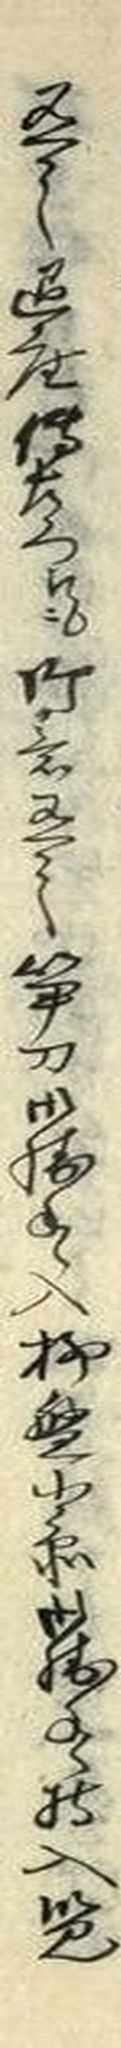有之退座伝左衛門江も御意有之筆刀御勝手へ入柳盤小兵衛御勝手へ持入覧
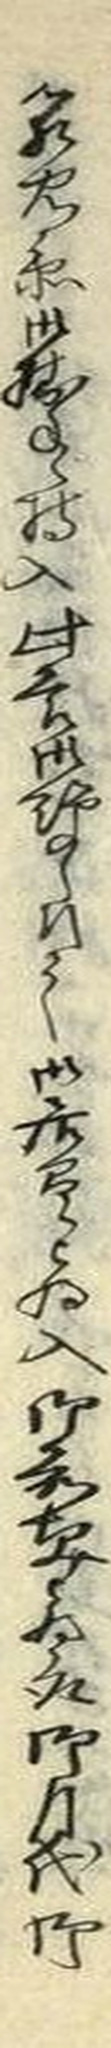箱忠兵衛御勝手へ持入此節御飾のし引之御居間へ被為入御前髪被為取御月代御
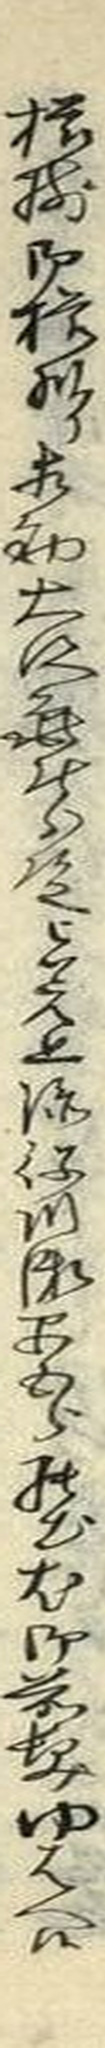櫛揃御櫛掛り相勤大沢亀次郎殿被差上添役川瀬安五郎罷出尤前髪ゆはへ候
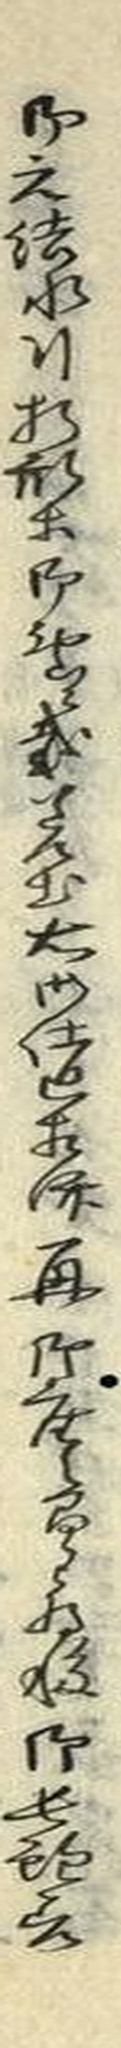御元結水引折形等御台ニ載差出右御仕廻相済再御座之間へ被為移御長鮑差
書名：少傅日録抄（斉善付側向頭取日記、在府）
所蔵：福井県文書館 Fukui Prefectural Archives
